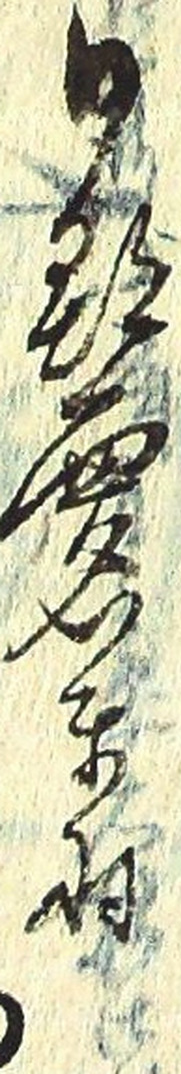同郡西名東村
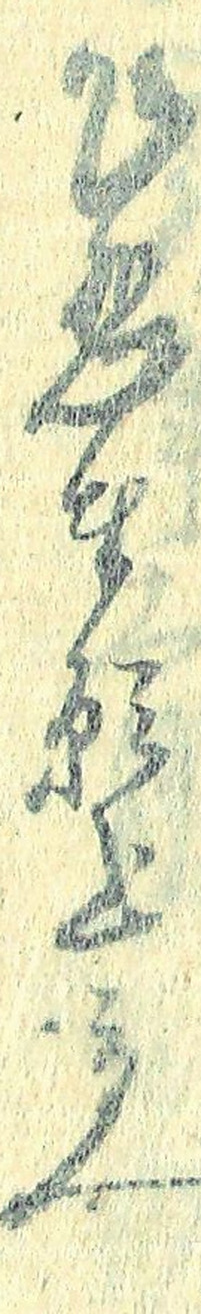乍恐奉願上覚
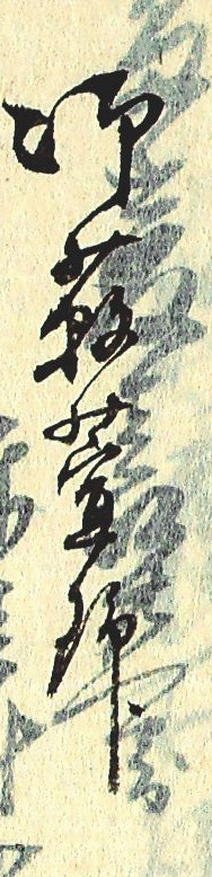御藪菅野
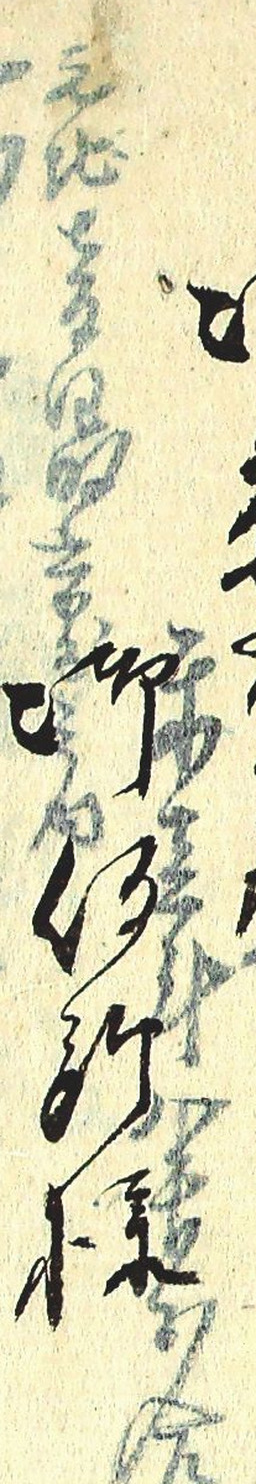御役所様
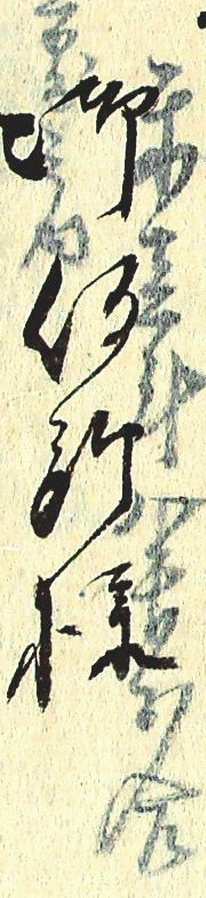御役所様

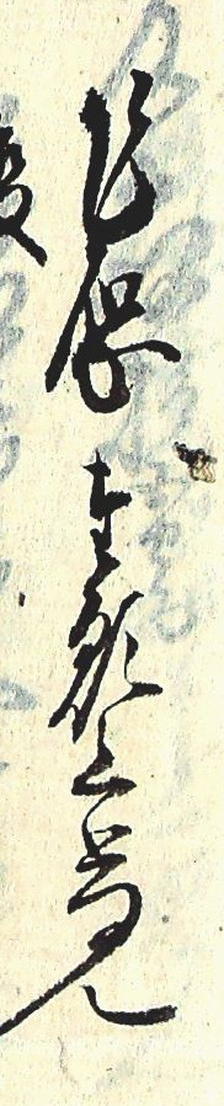乍恐奉願上覚
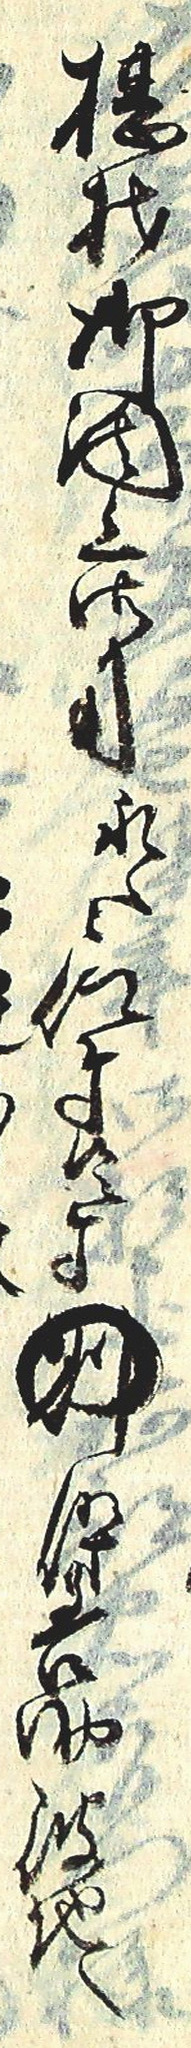椹材御調上御用私へ被仰付候に付「則」倅善助彼地へ
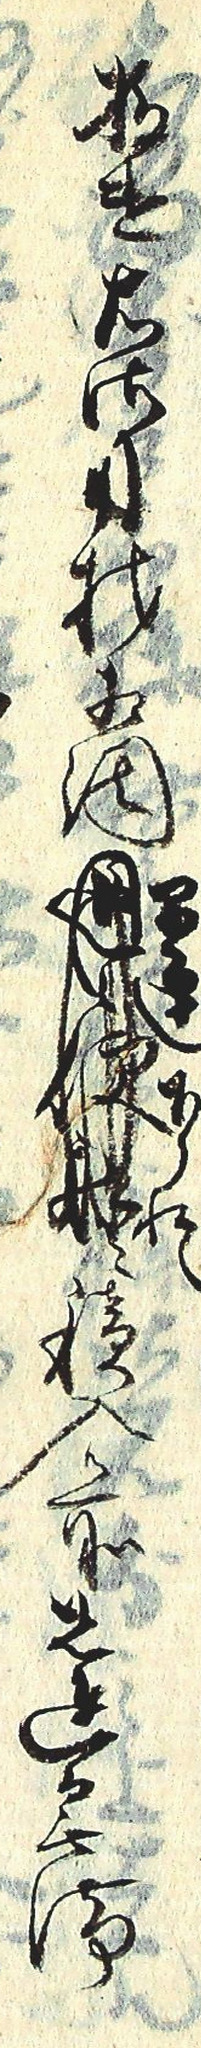指遣右御用材相調早速下り船へ積入候所先達て無滞
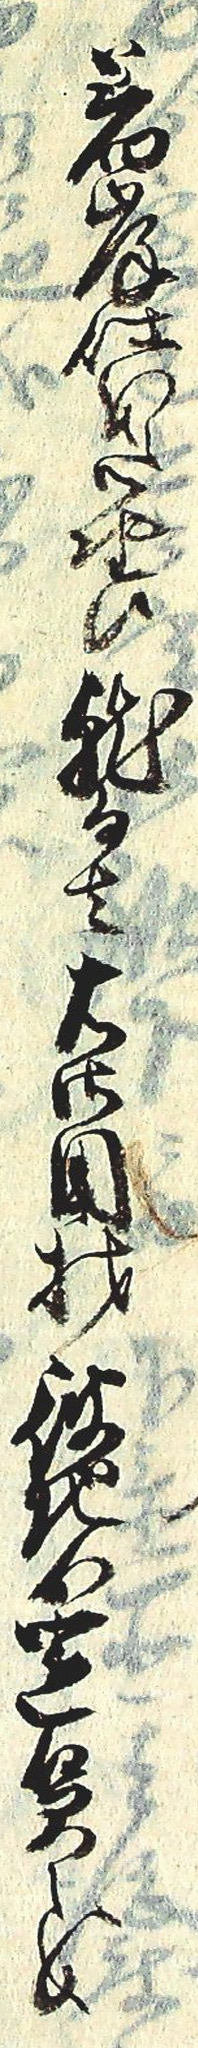着岸仕義に御座候就ては右御用材彼地ゟ運賃之義
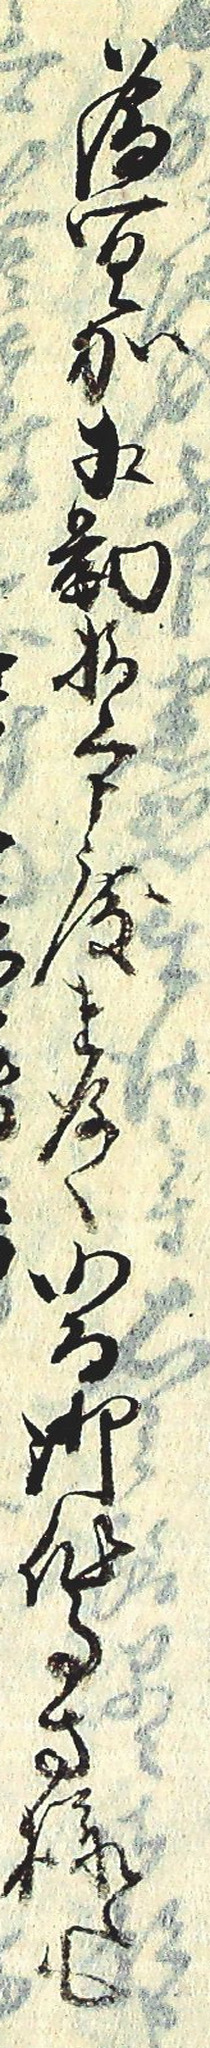為冥加相勤指上申度奉存候仍て御作事方様へも
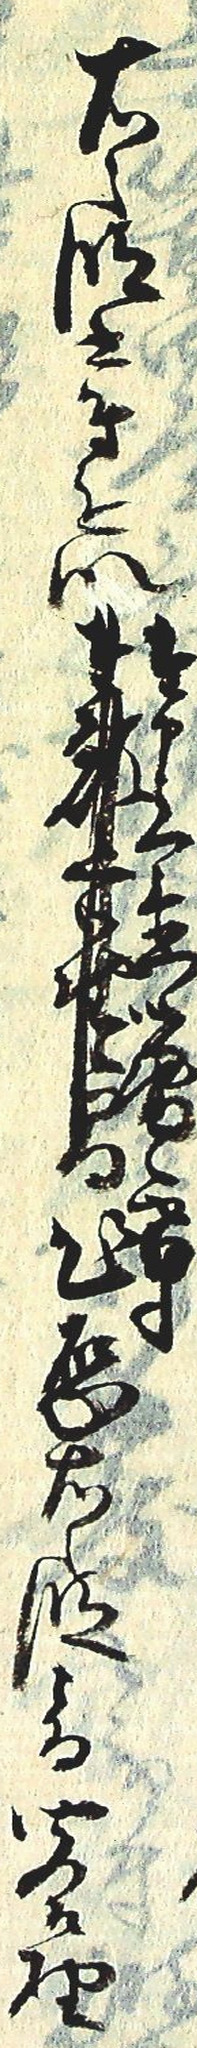右之段書付を以奉申上置候間乍恐右之段被為聞召届
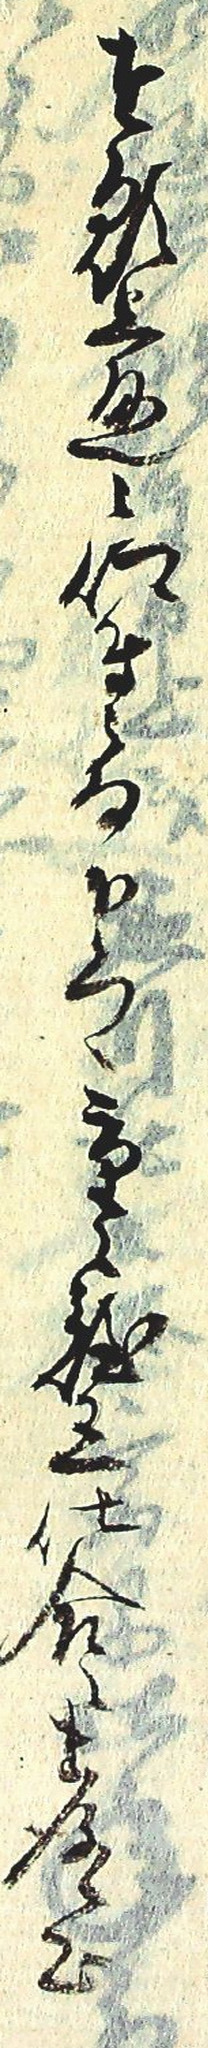奉願上通被仰付被為下候はゝ重々難有仕合に奉存候以上
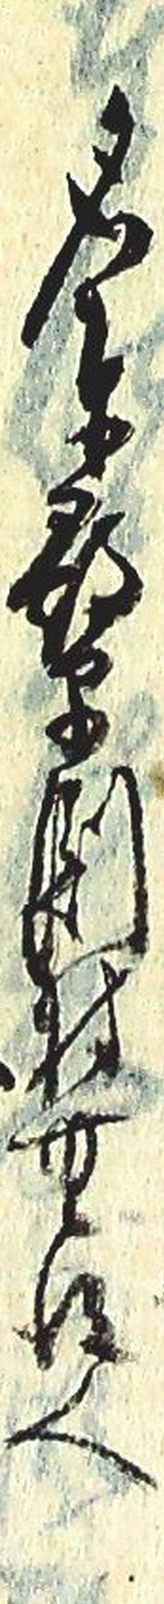名東郡早淵村無役人
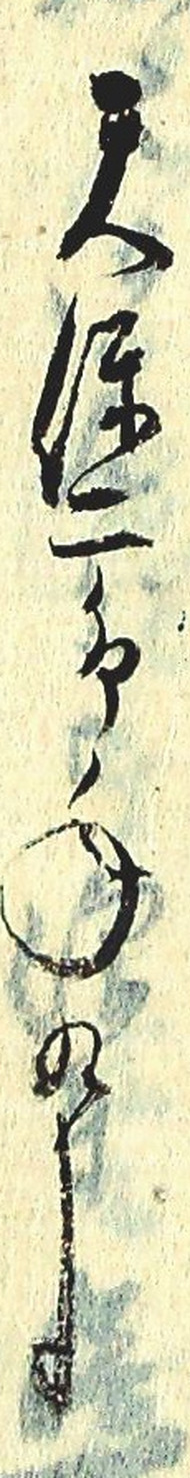天保二卯年九月
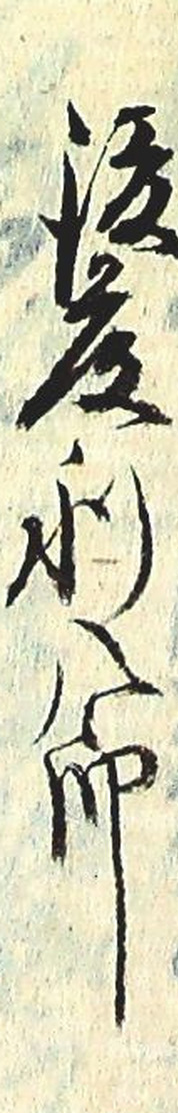後藤利八郎
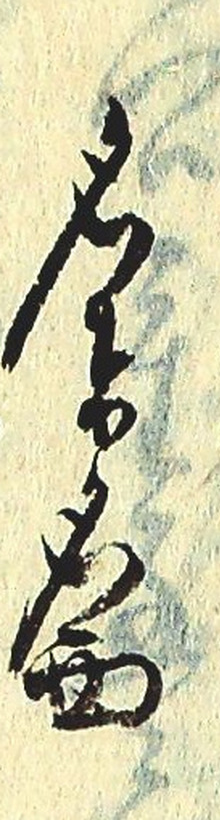名東名西
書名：諸御願書控(弐番）
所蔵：鳴門教育大学 Naruto University of Education
